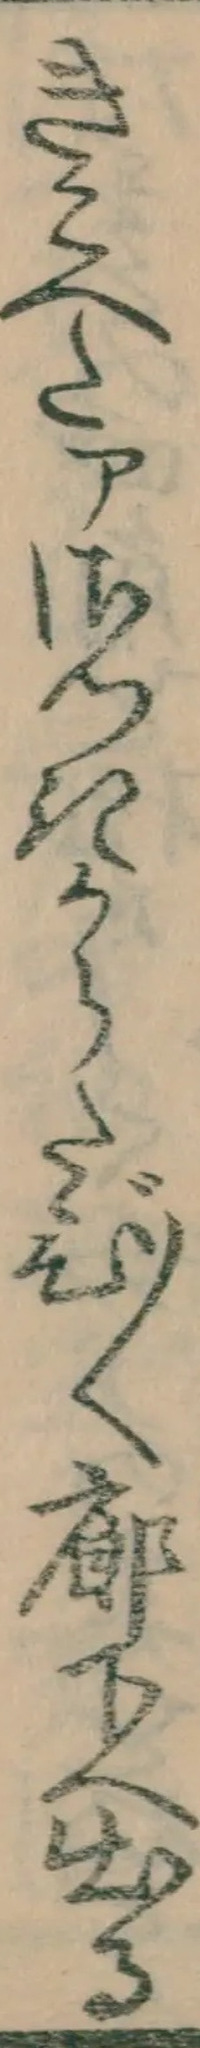きこへたァさつきからたび〳〵廊下へ出る
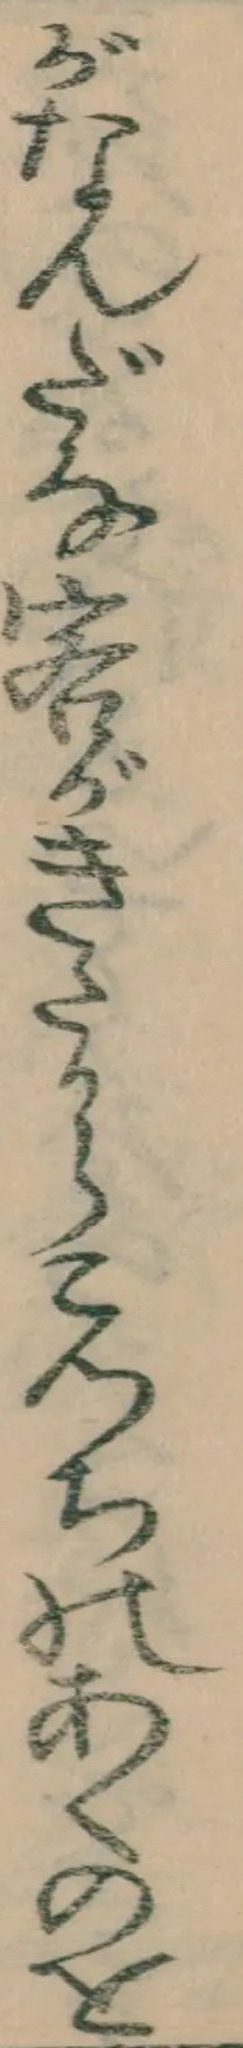がなんだな客がきたからこつちのあくのを
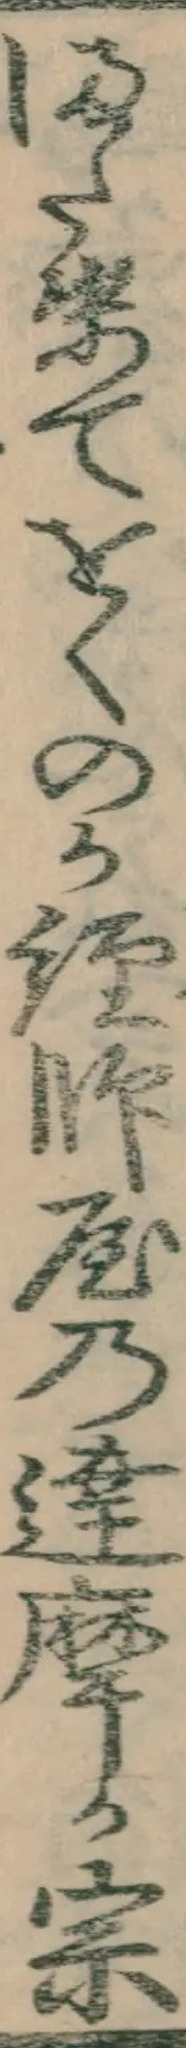またせてをくのか経師屋の達摩か宗
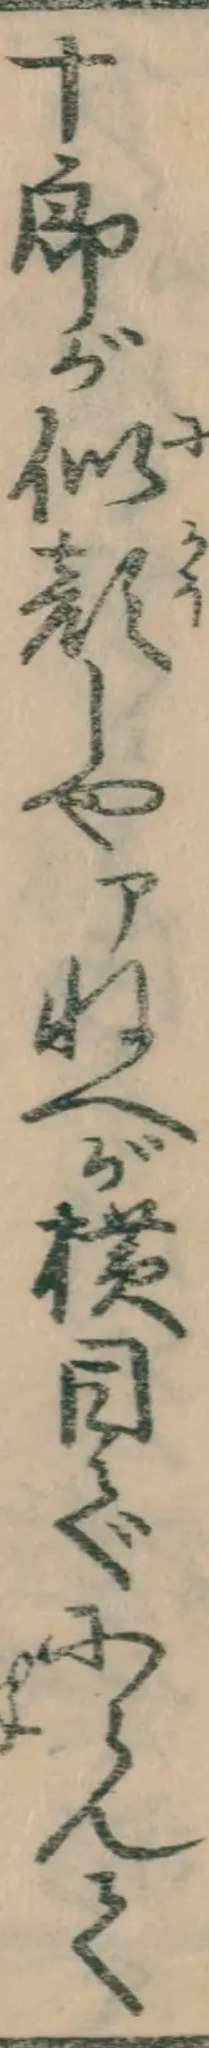十郎が似顔しやァねへが横目でにらんて
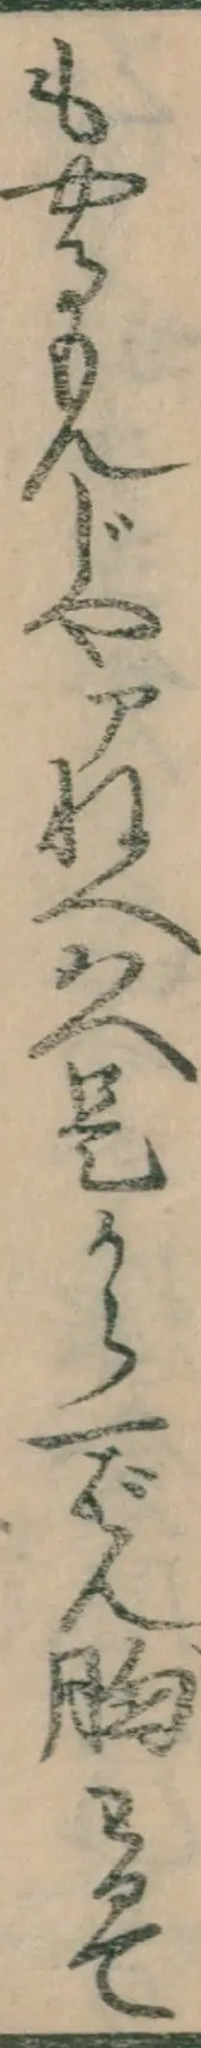もやるもんじやァねへはへ是から一ばん胸わるて
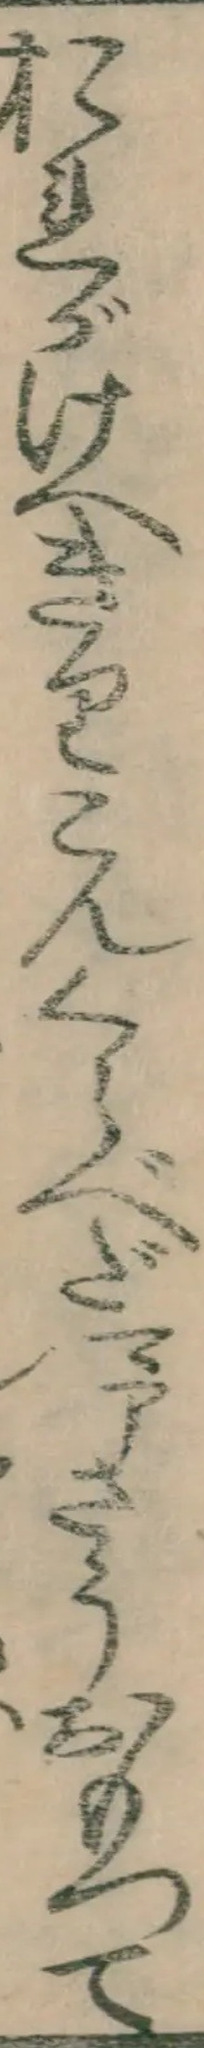おれがけへきりこんくらべだマアさうおもつて
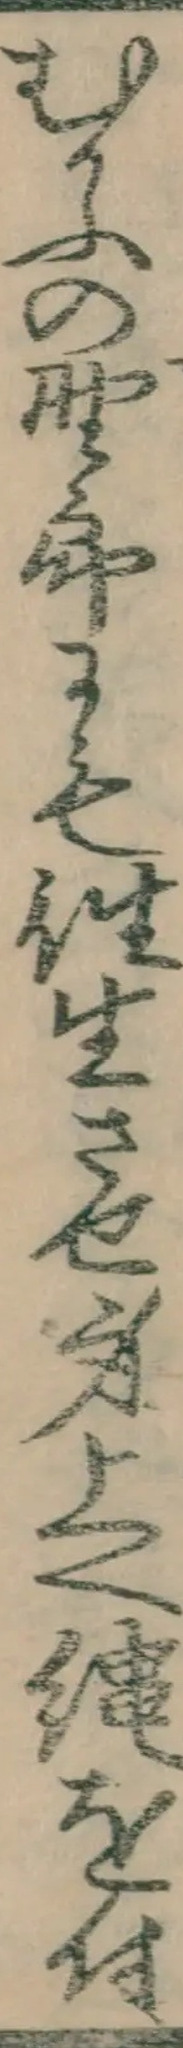むかふの野郎にも往生させ身上へ縄を付

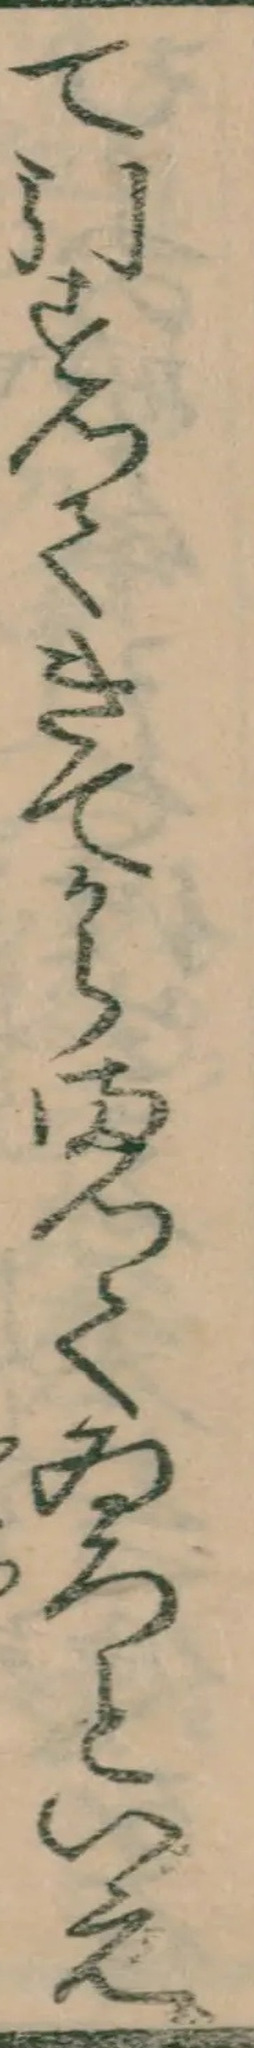て引すつてきてからまつてゐろといえ
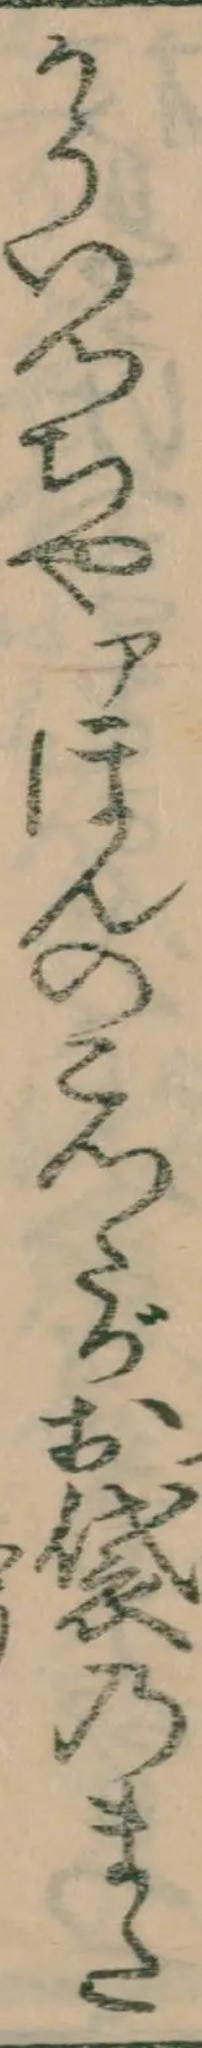かういつちやァほんのこつたがお袋のまた
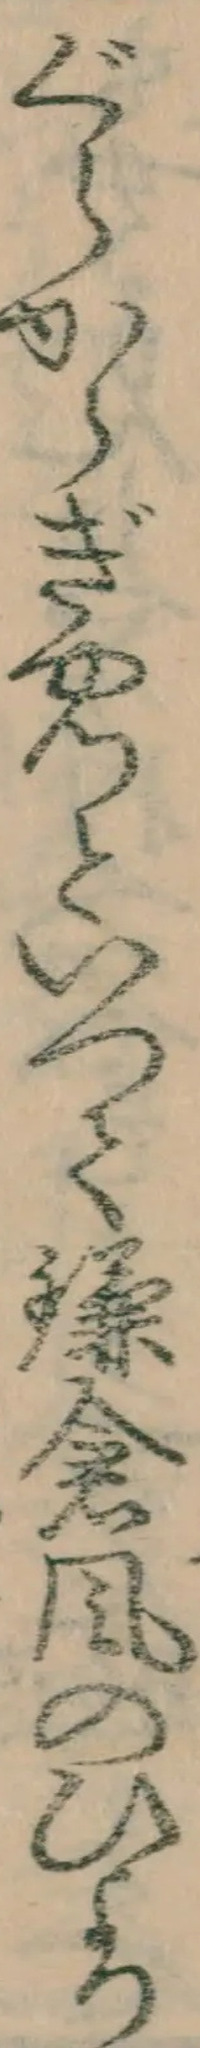ぐらからぎやつといつて鎌倉風のひより
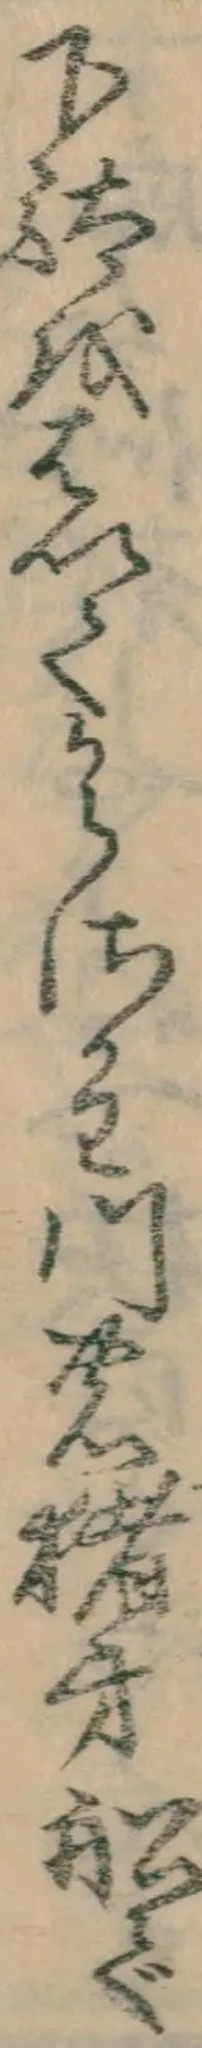下駄をはいてからさかわ川の猪牙船で
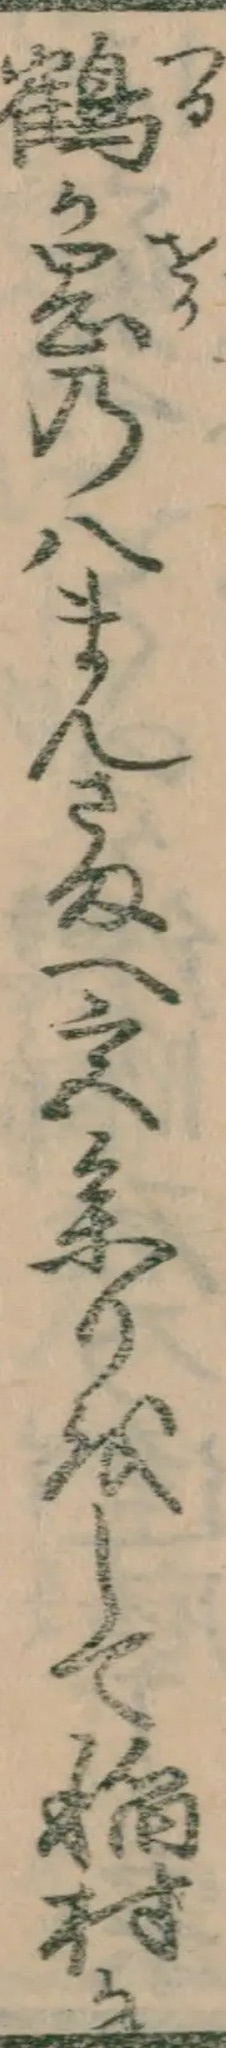鶴か岡の八まんさまへ宮参りをして稲村か
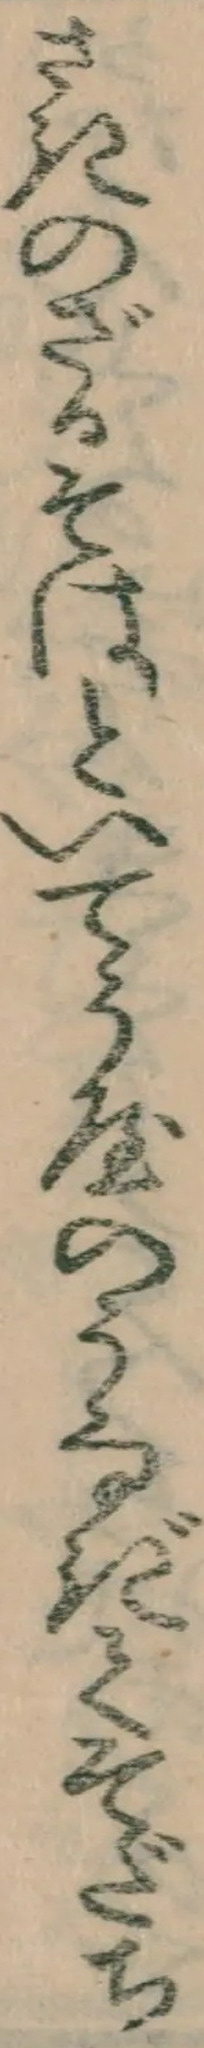さきのざるそはといてう屋のうなぎてそだち
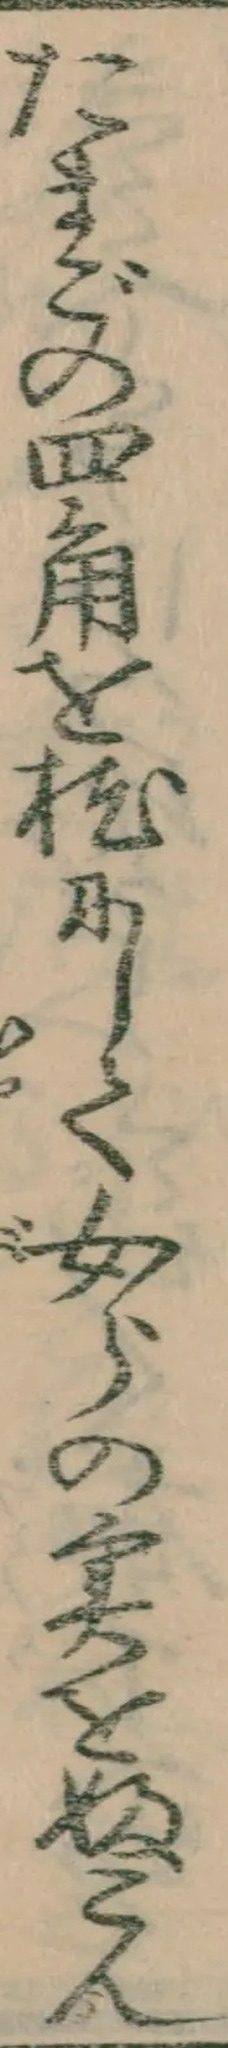たまごの四角を枕にして女郎の実をふとん
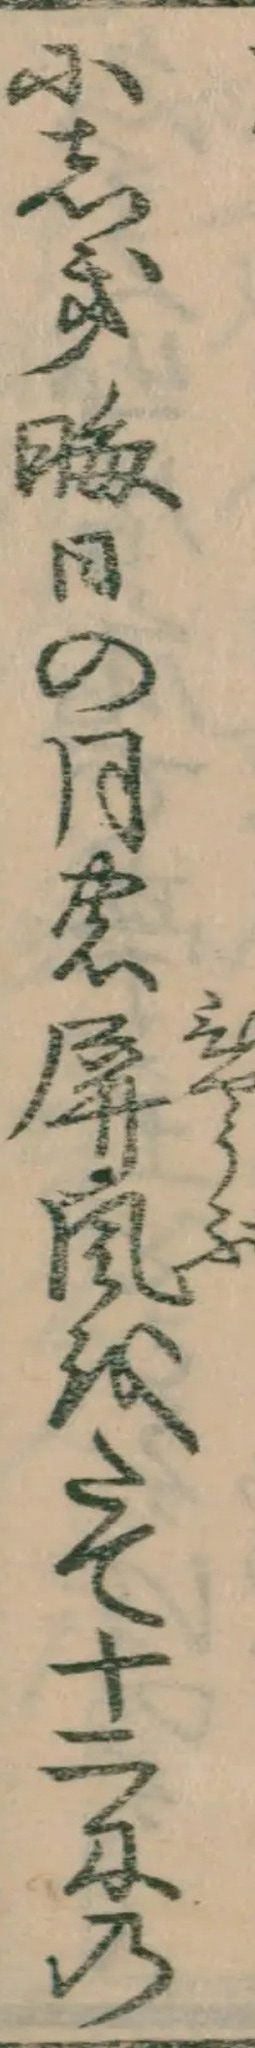にしき晦日の月の屏風をたて十二匁の
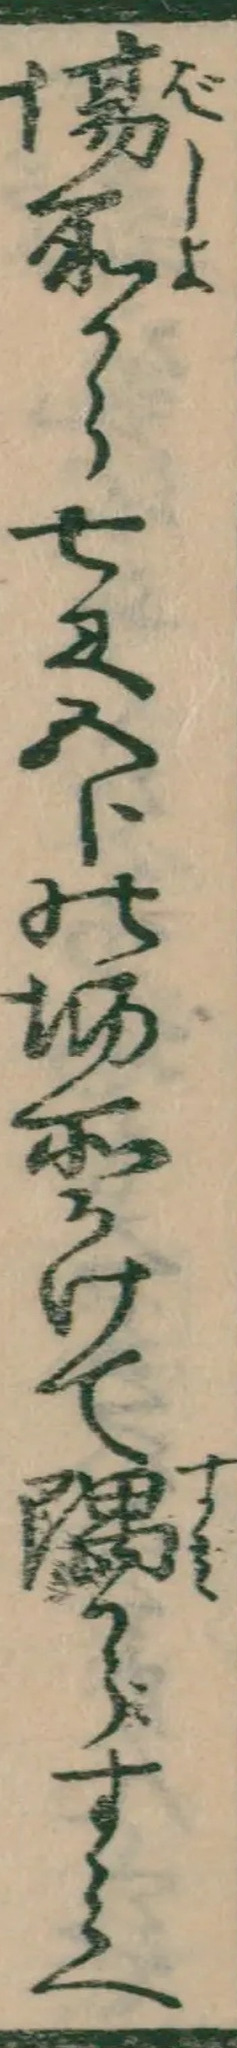場所から七匁五分の場所かけて隅からすらへ
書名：教訓読本：大礒風俗仕懸文庫
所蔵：国立国会図書館 National Diet Library, JAPAN
